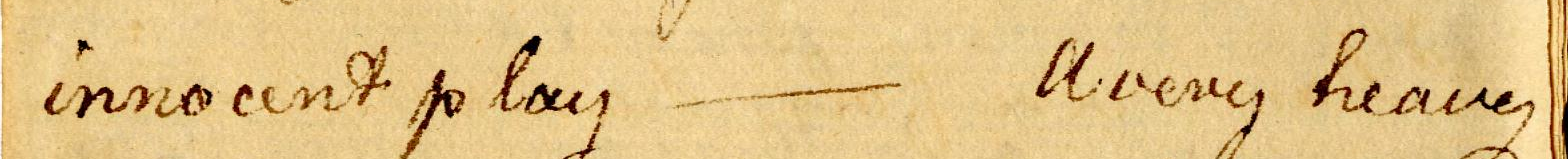innocent play- A very heavy
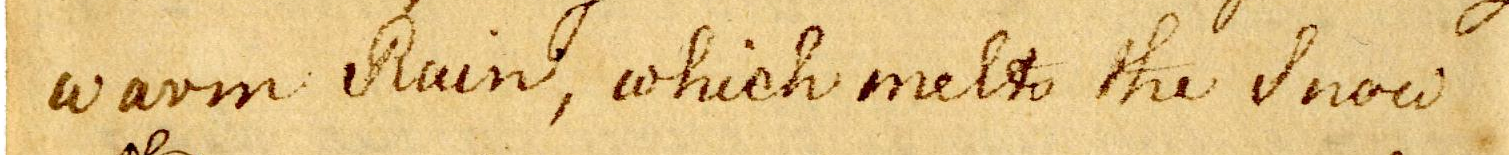warm Rain, which melts the Snow
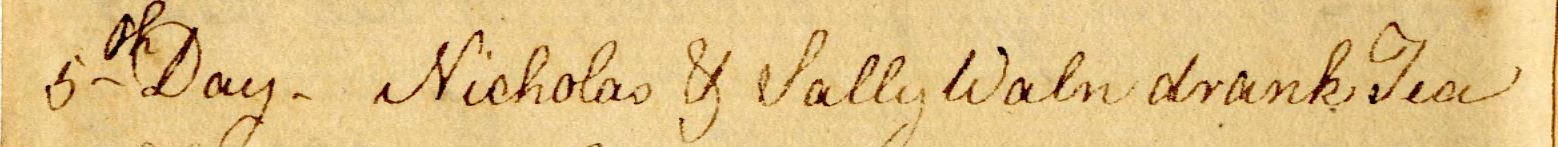5^th Day- Nicholas & Sally Waln drank Tea
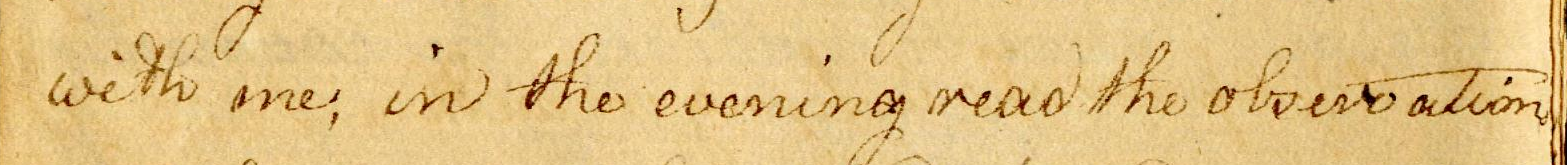with me, in the evening read the observation
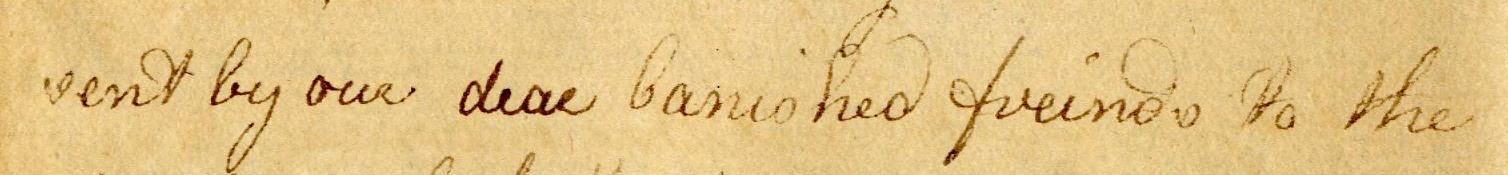sent by our dear banished freinds to the
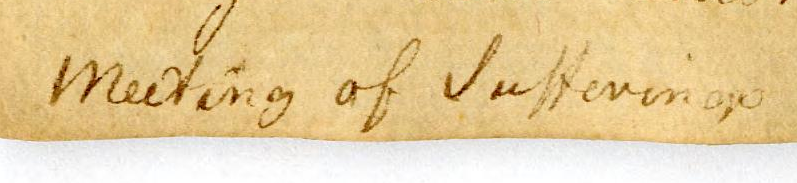Meeting of Sufferings
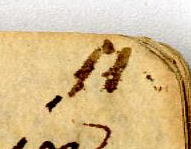11
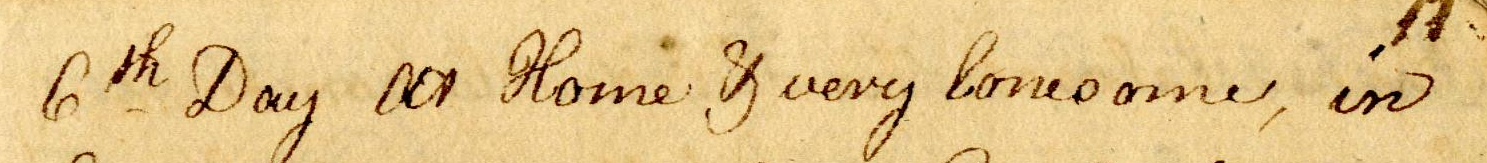6^th Day At Home & very lonesome, in
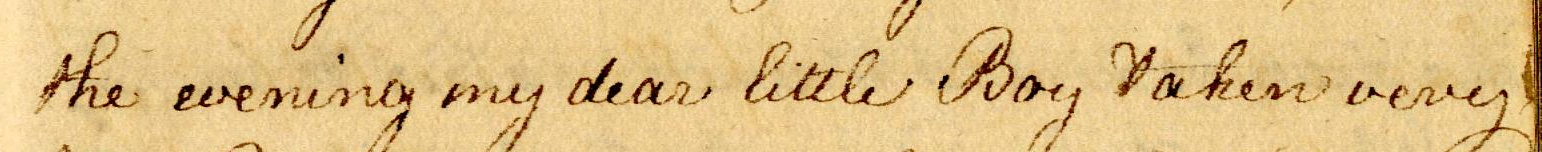the evening my dear little Boy taken very
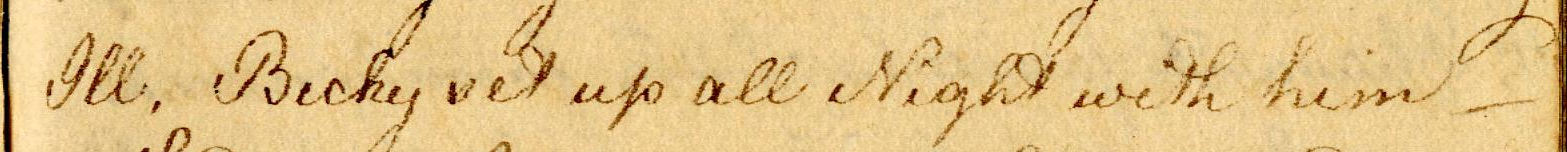Ill. Becky set up all Night with him-
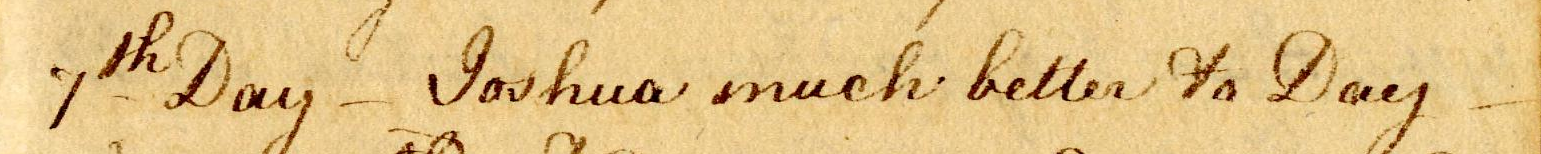7^th Day- Joshua much better to Day-
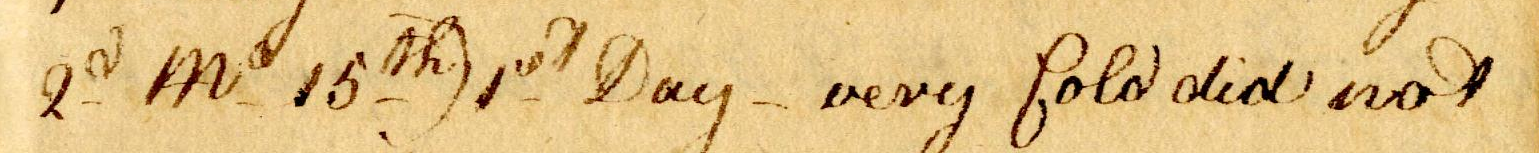2^d M^o 15^th) 1^st Day- very Cold did not
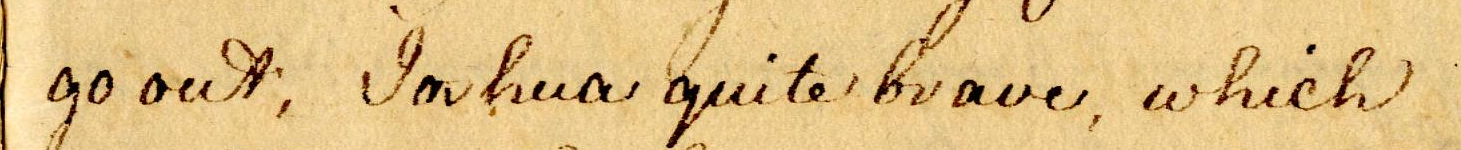go out, Joshua quite brave which
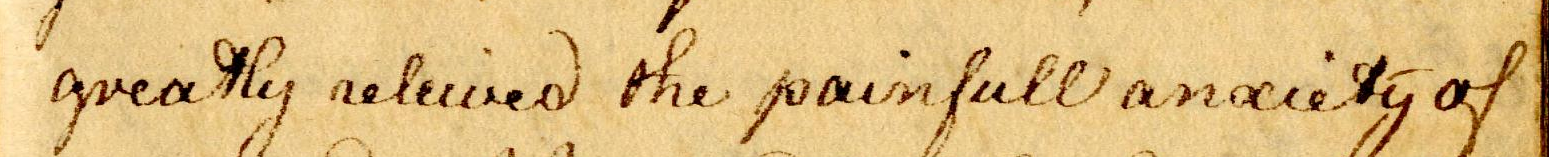greatly releived the painfull anxiety of
